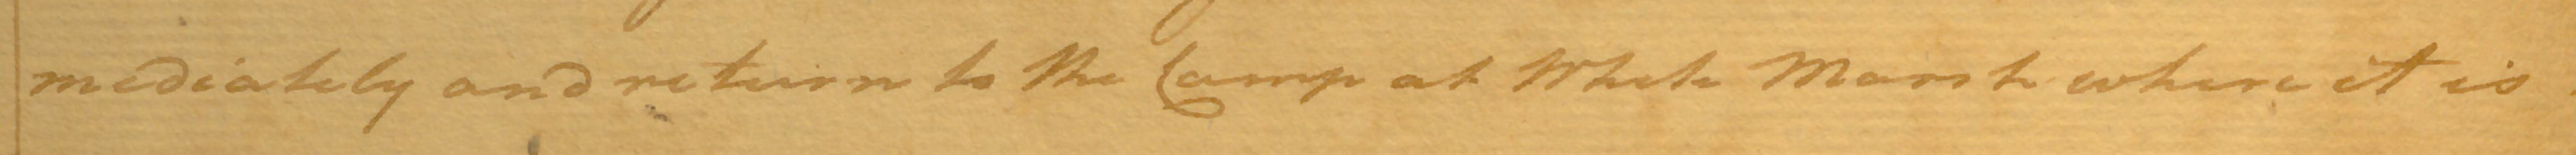mediately and return to the Camp at White Marsh where it is
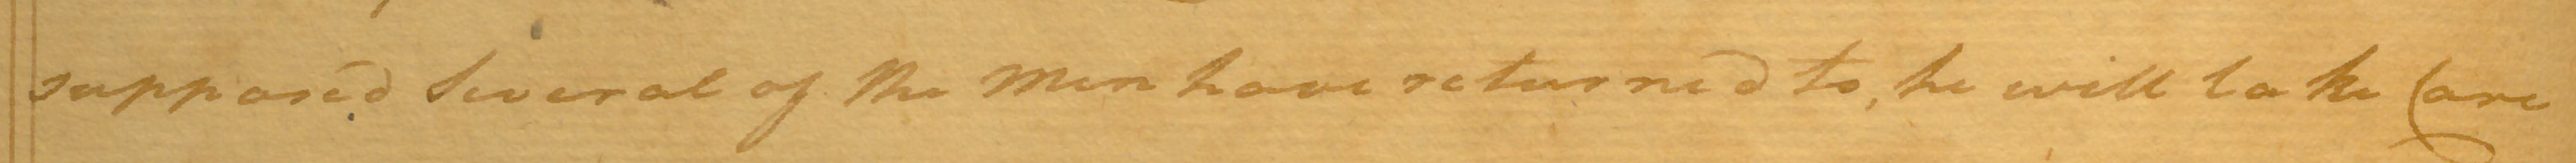supposed Several of the men have returned to, he will take Care
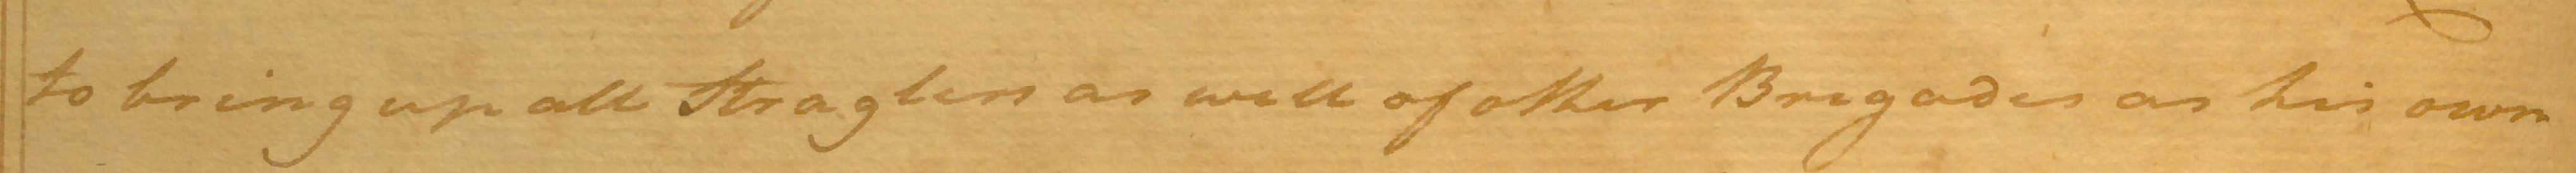to bring up all Straglers as well of other Brigades as his own
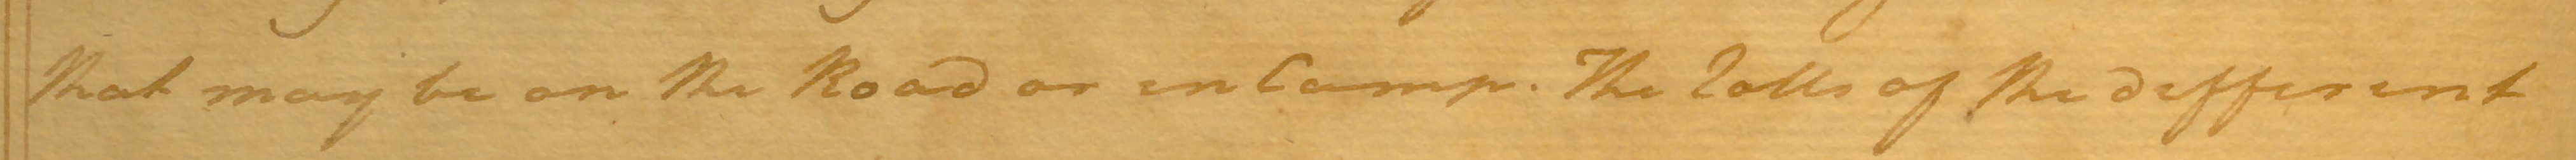that may be on the Road or in Camp. The rolls of the different
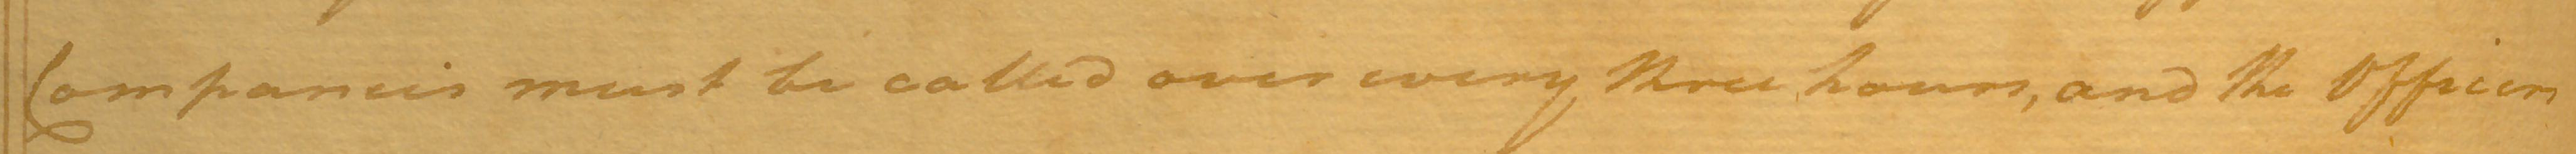Companies must be called over every three hours, and the Officers
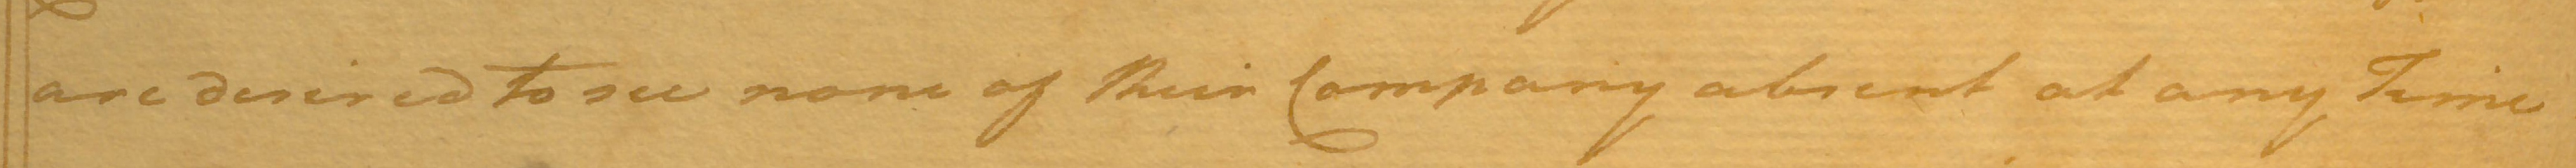are desired to see none of their Company absent at any Time
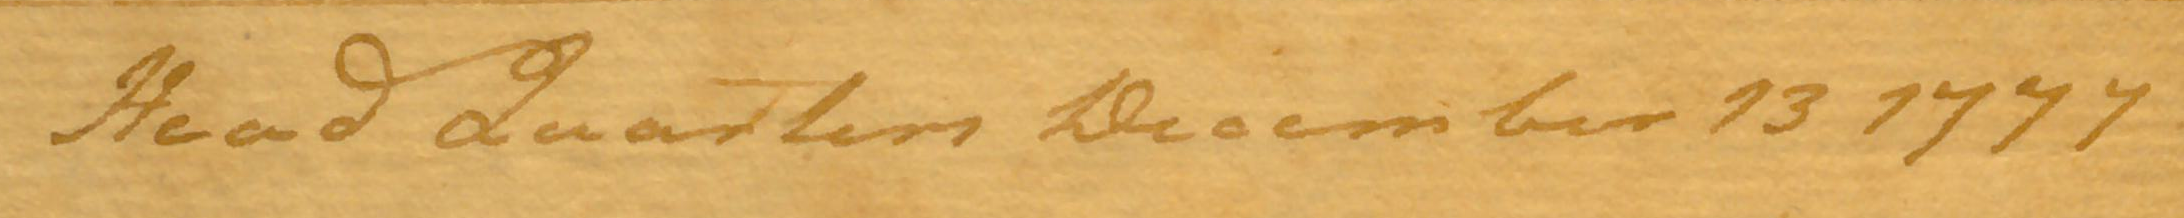Head Quarters December 13 1777
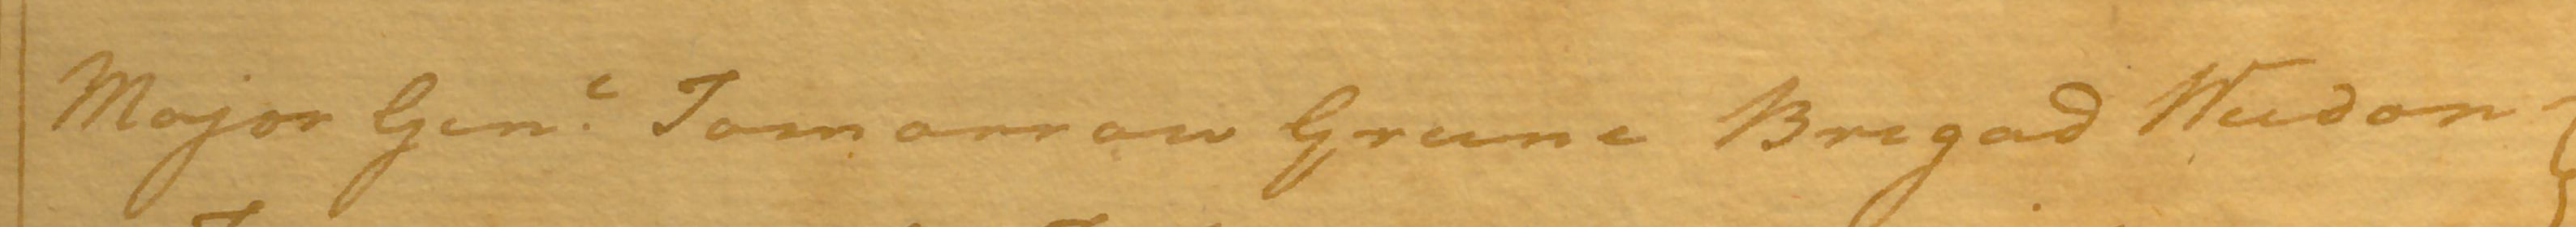Major Gen^l. Tomorrow Greene Brigade Weedon
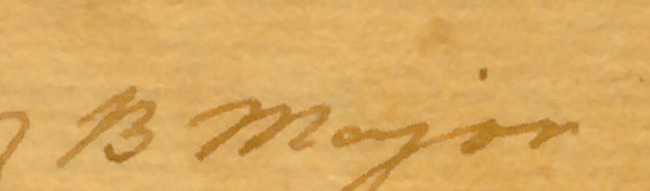B Major
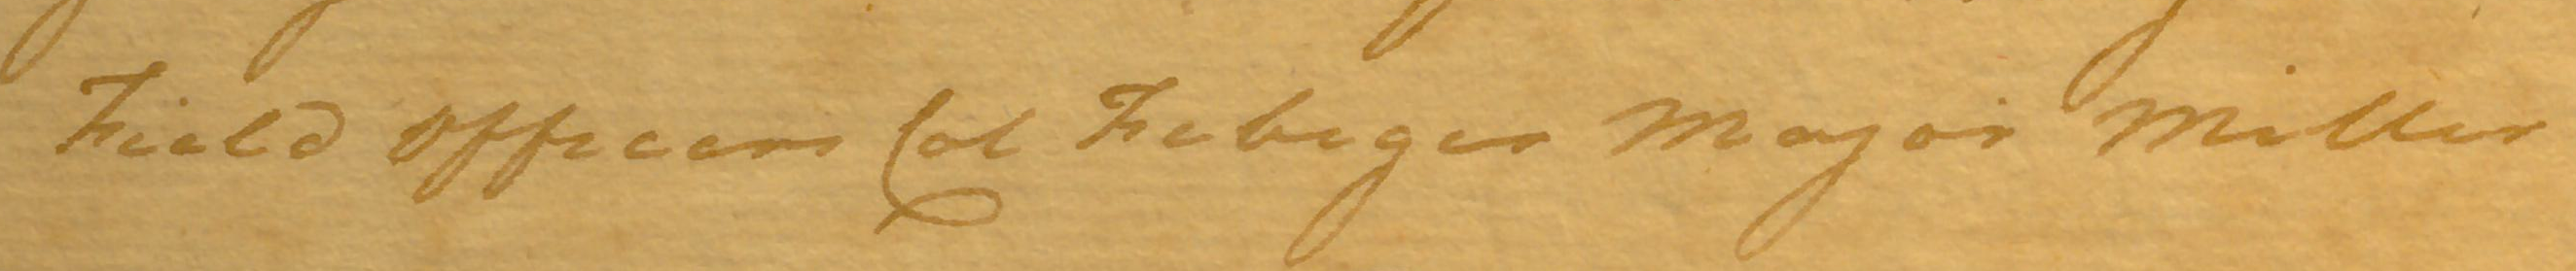Field Officers Col Febiger Major Miller
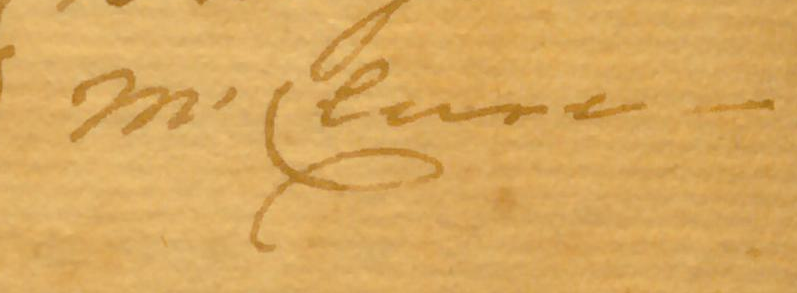M'Clure-
